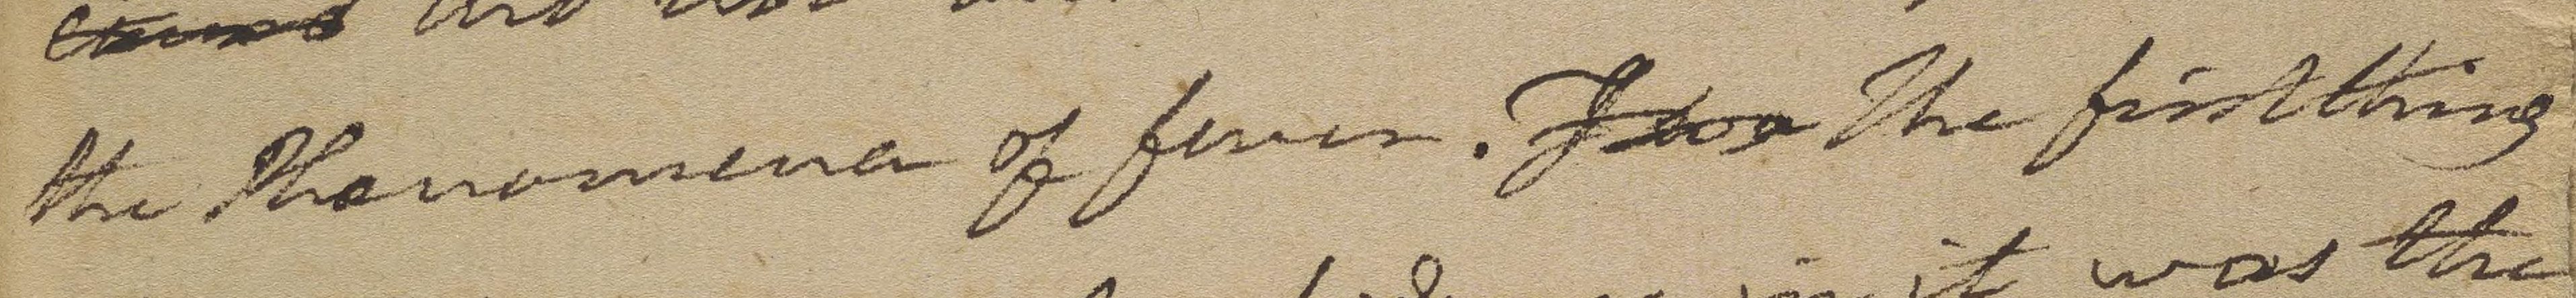the phenomena of fever. [In a] The first thing
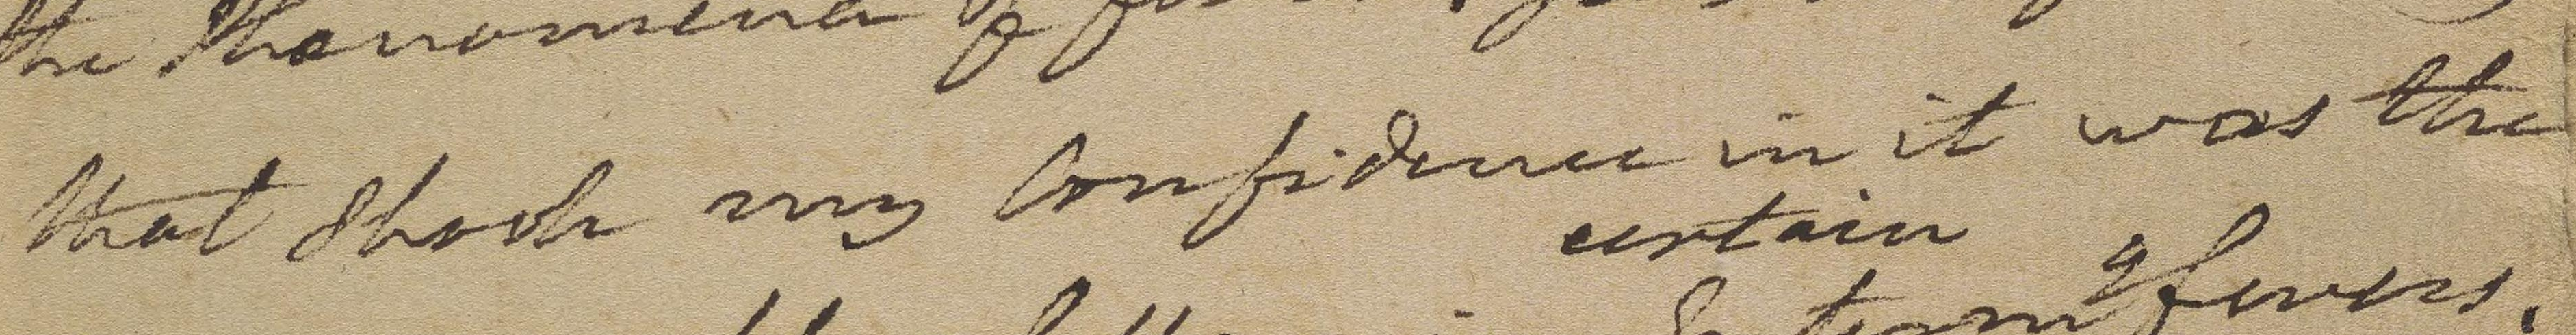that shook my confidence in it was the
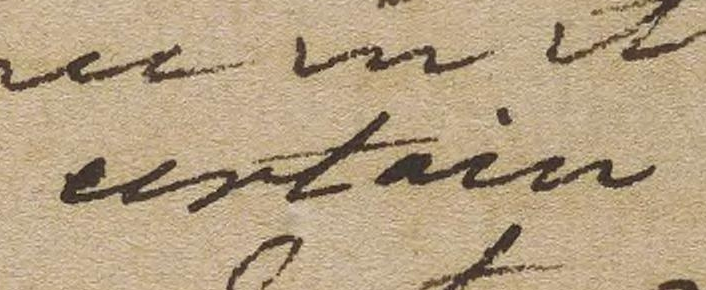certain
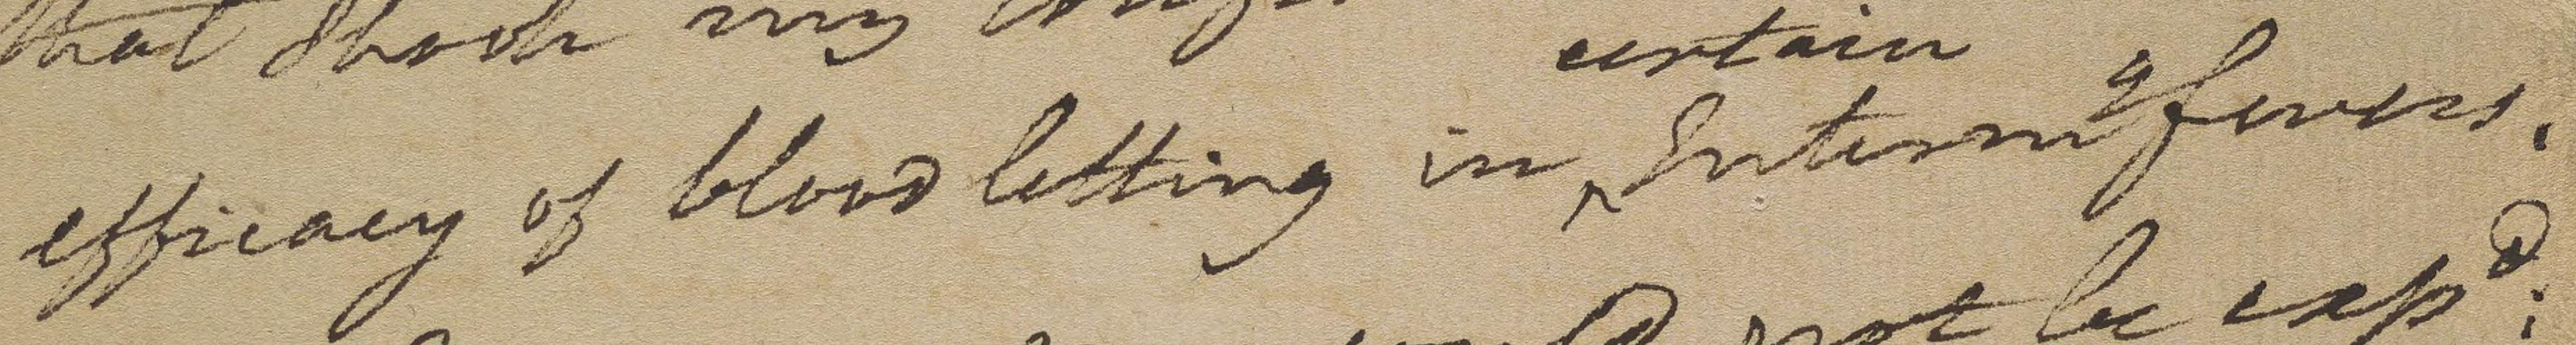efficacy of blood letting in ^ Interim^g fevers.
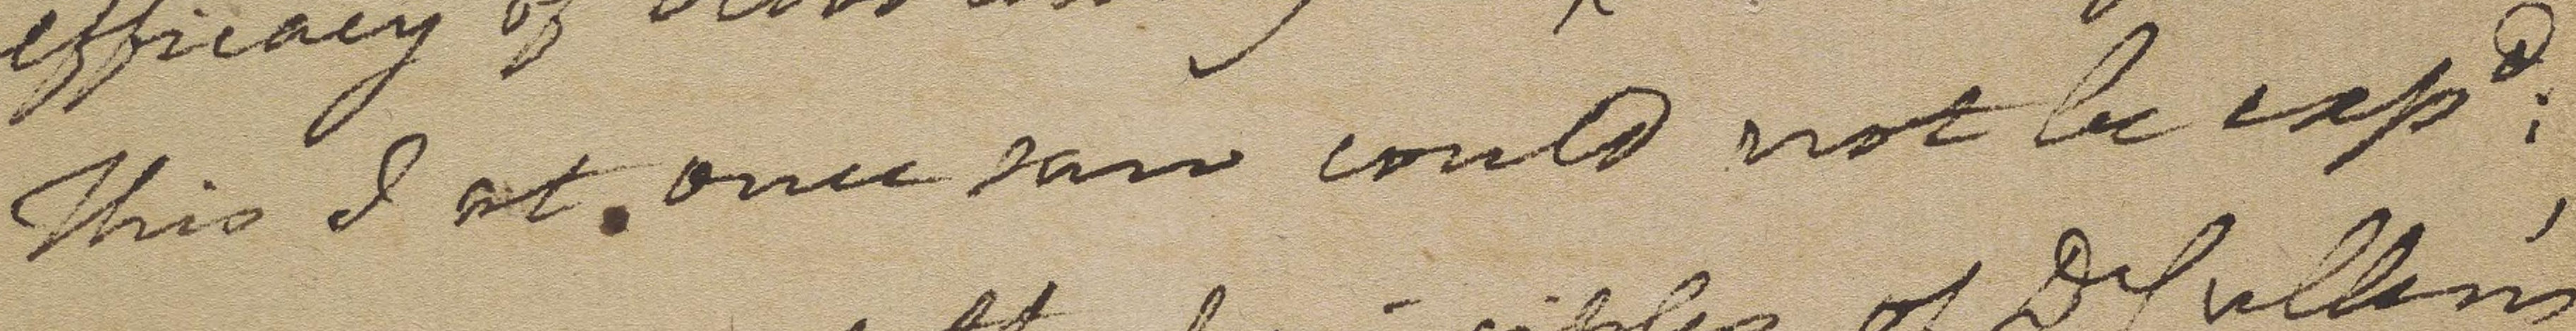This I at once saw could not be exp^d:
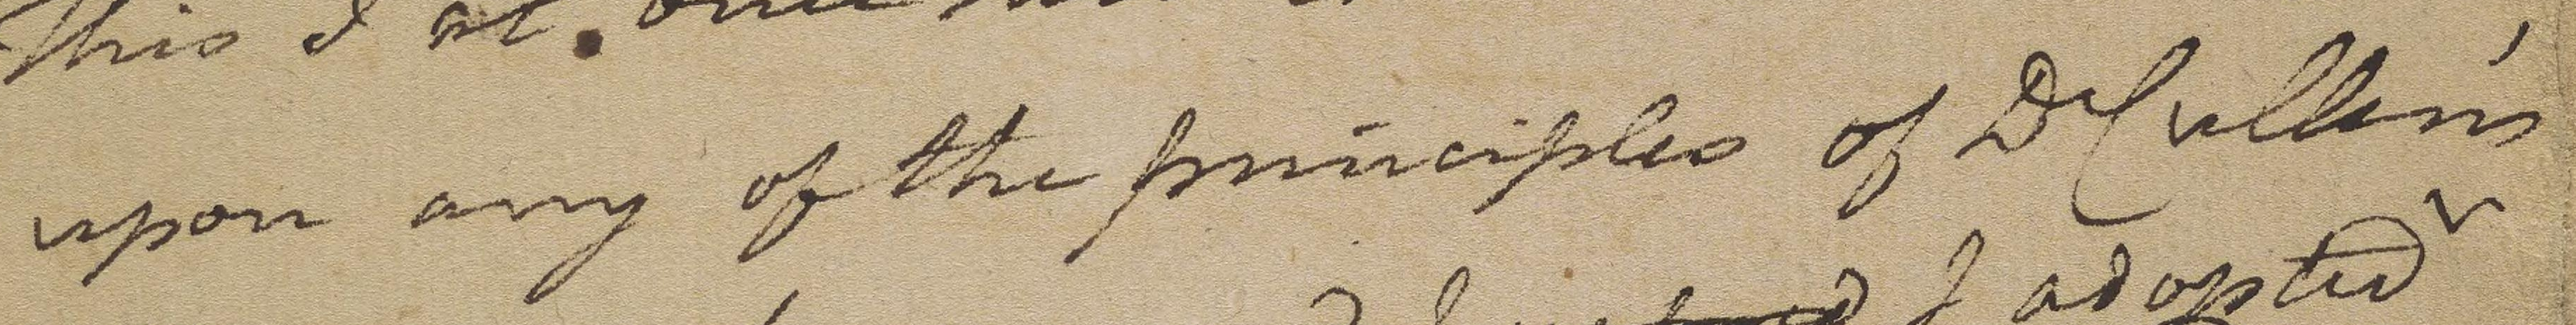upon any of the principles fo D^r Cullen's
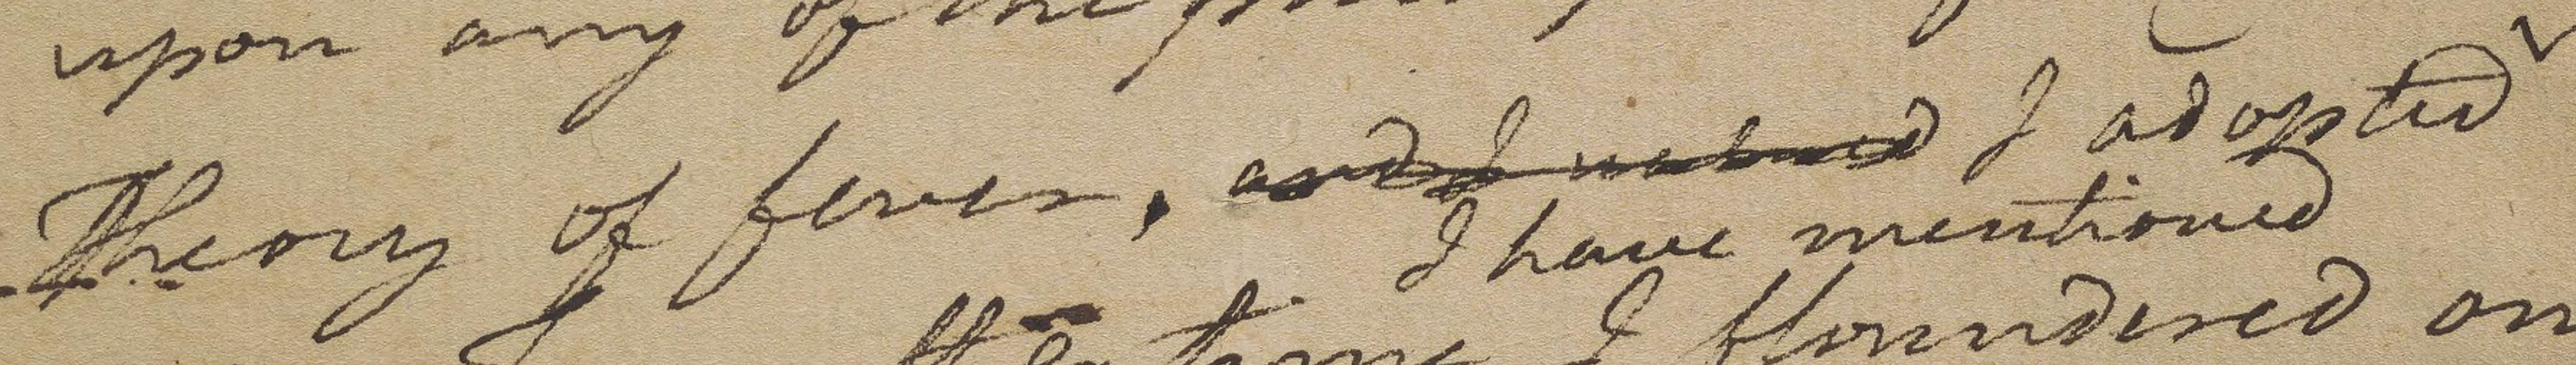Theory of fever. [and I ______] I adopted
